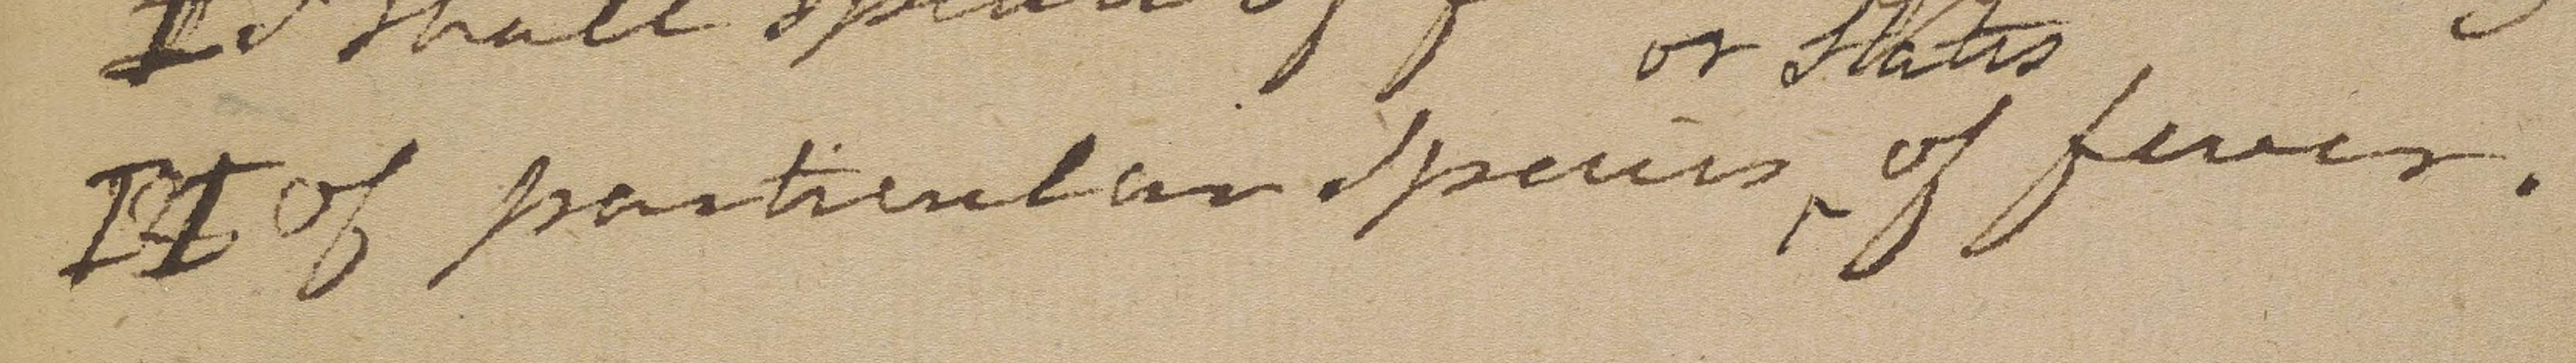II of particular species ^ of fever.
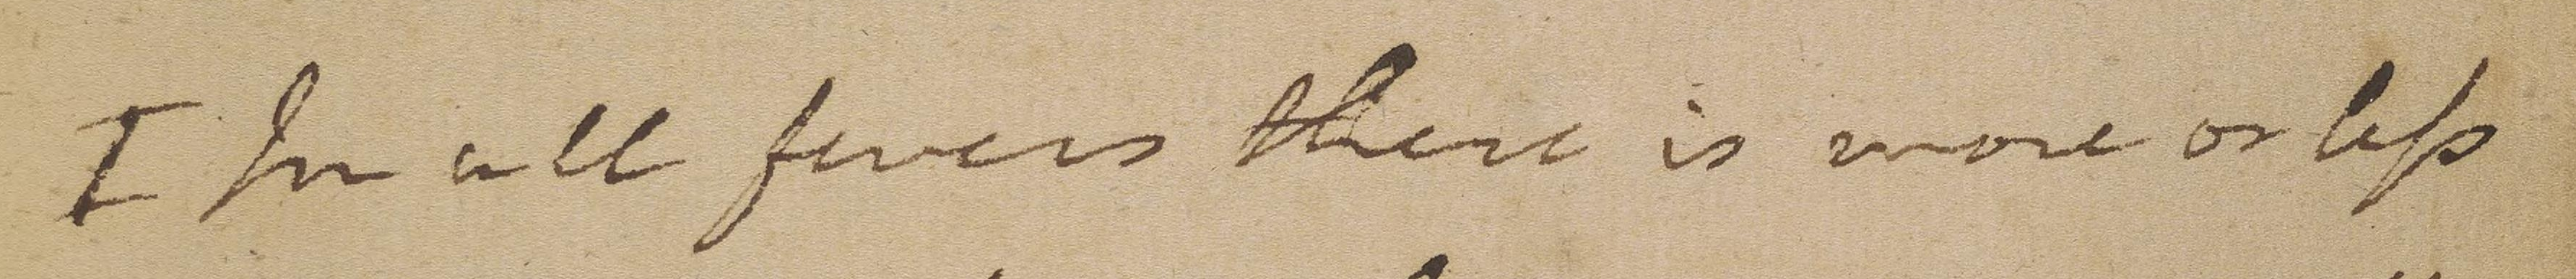pain in the head, breast & joints. This
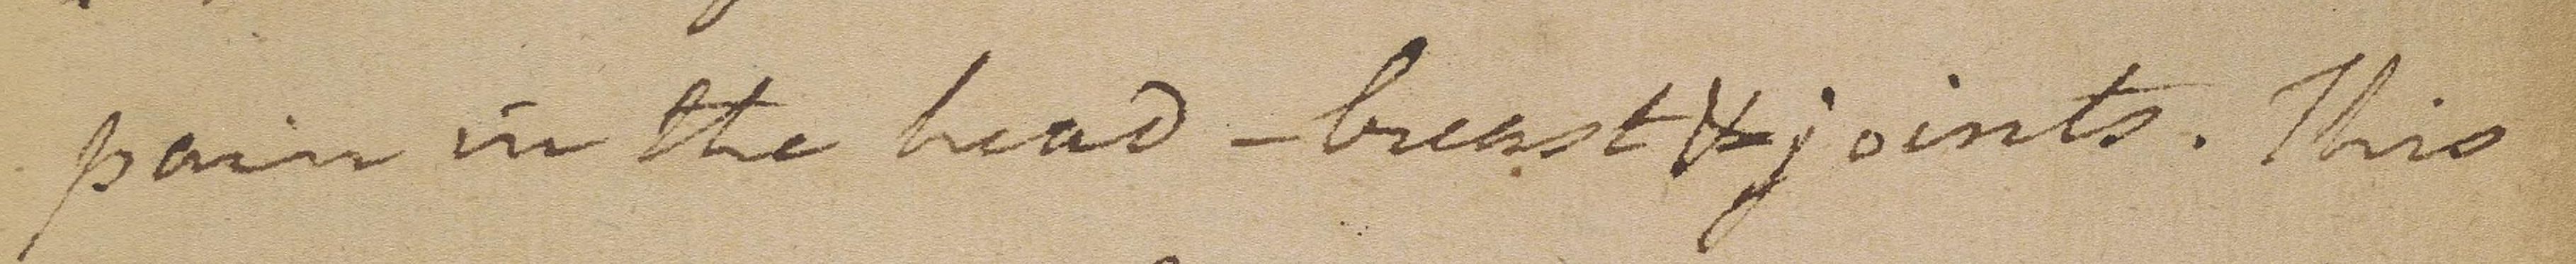pain in the head, breast & joints. This
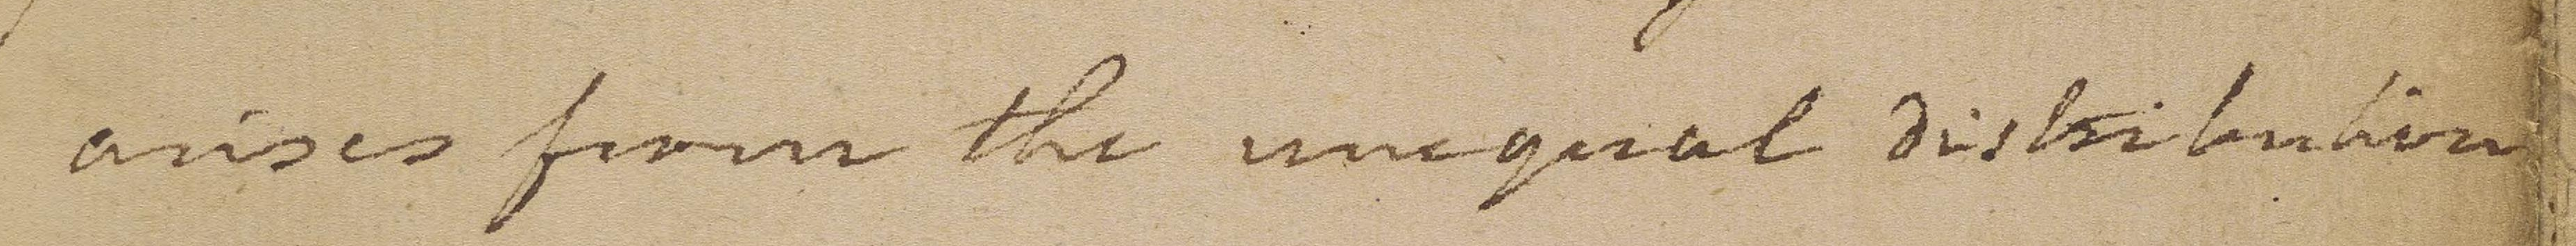arises from the unequal distribution
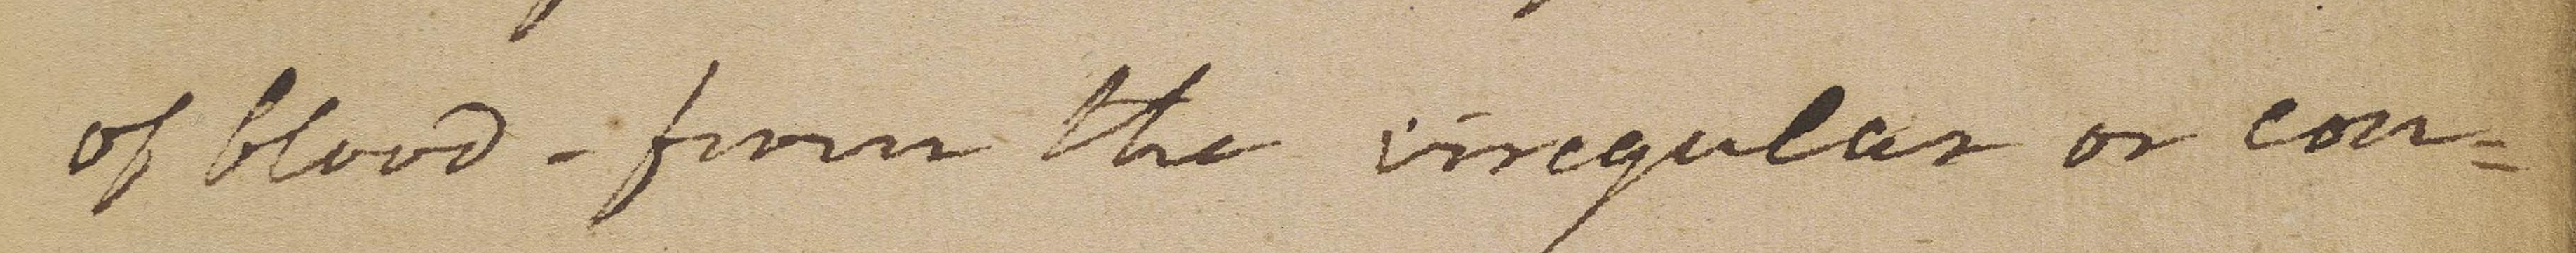of blood, from the irregular or con-
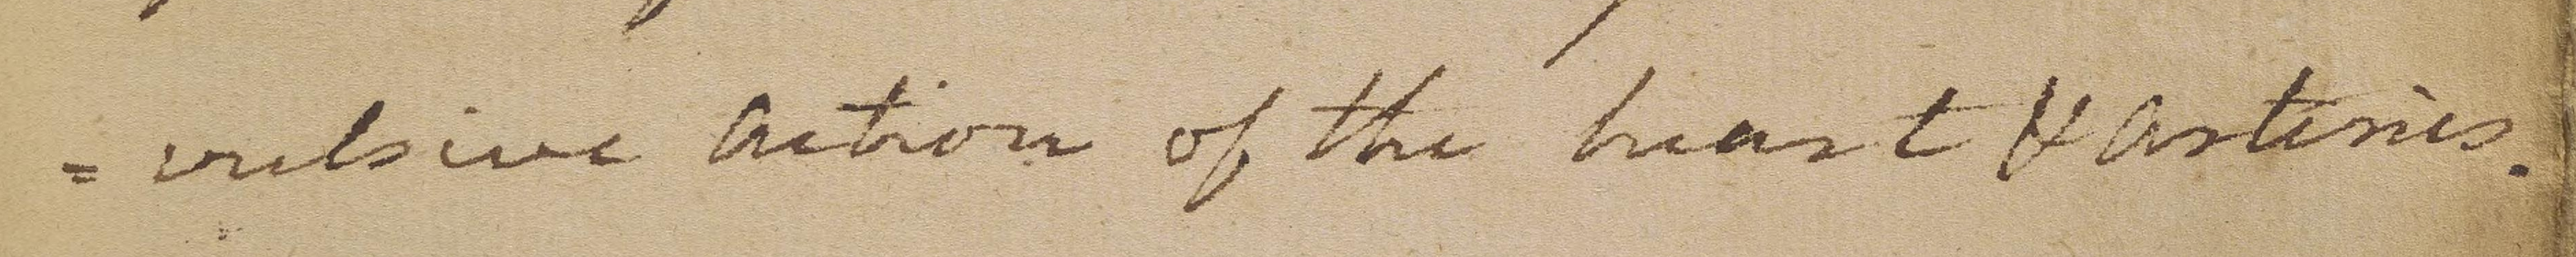-vulsive action of the heart & arteries
